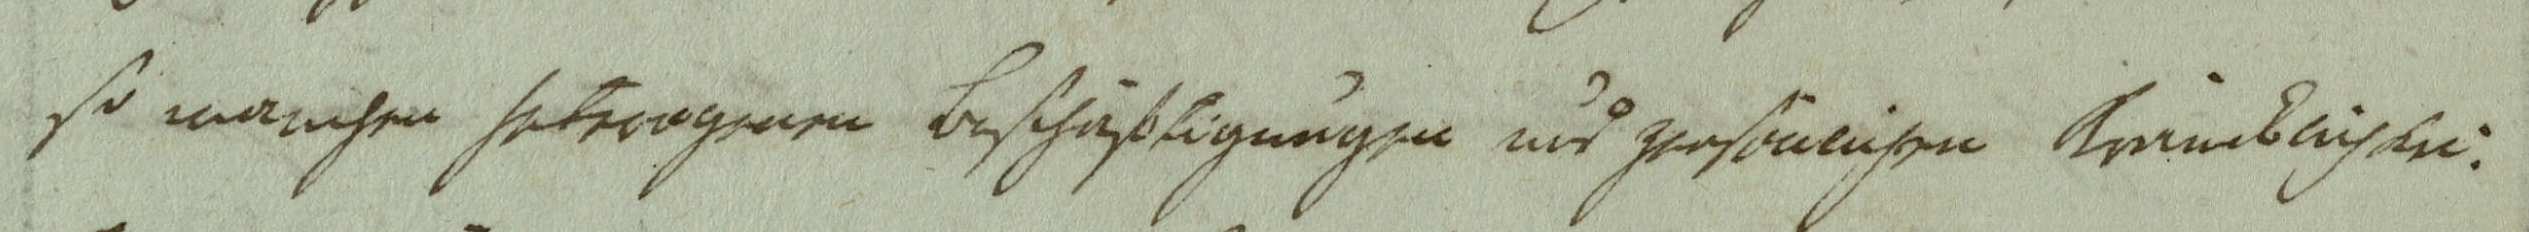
so manchen heterogenen Beschäftigungen und persönlichen Kräncklichkei¬
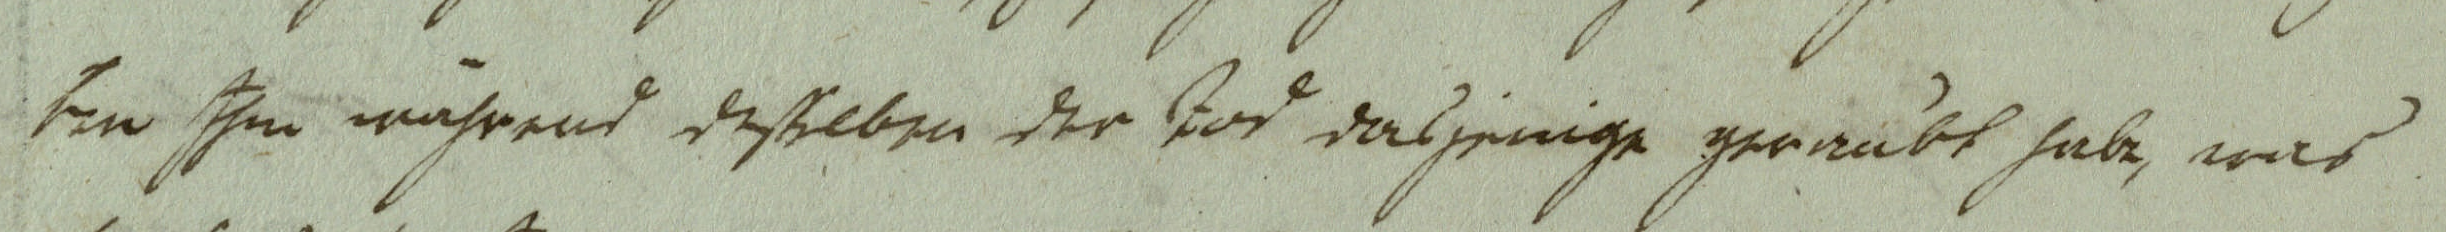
ten Ihm während desselben der Tod dasjenige geraubt habe, was
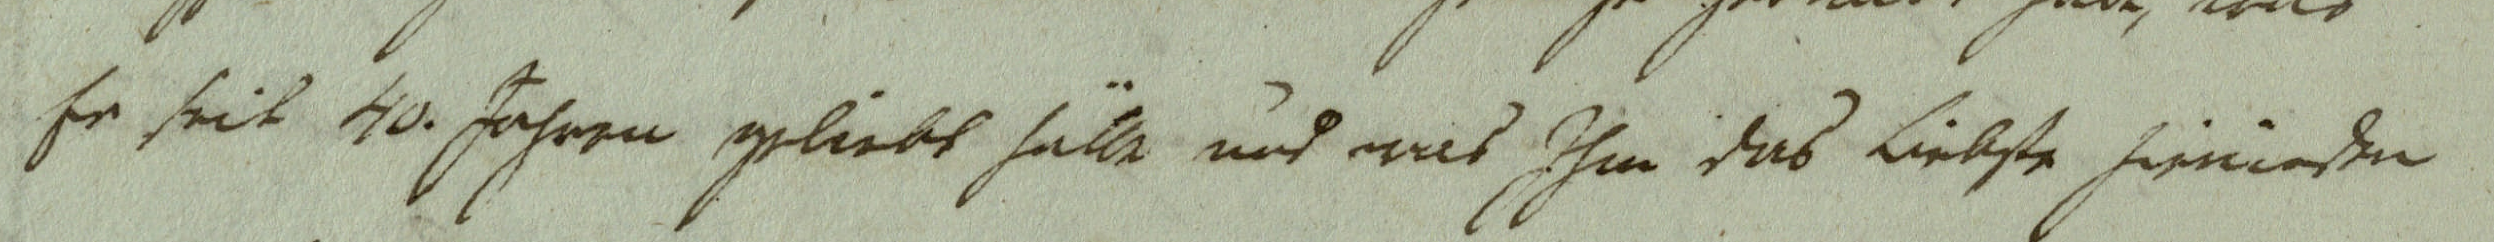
Er seit 40. Jahren geliebt hätte und was Ihm das Liebste hienieden
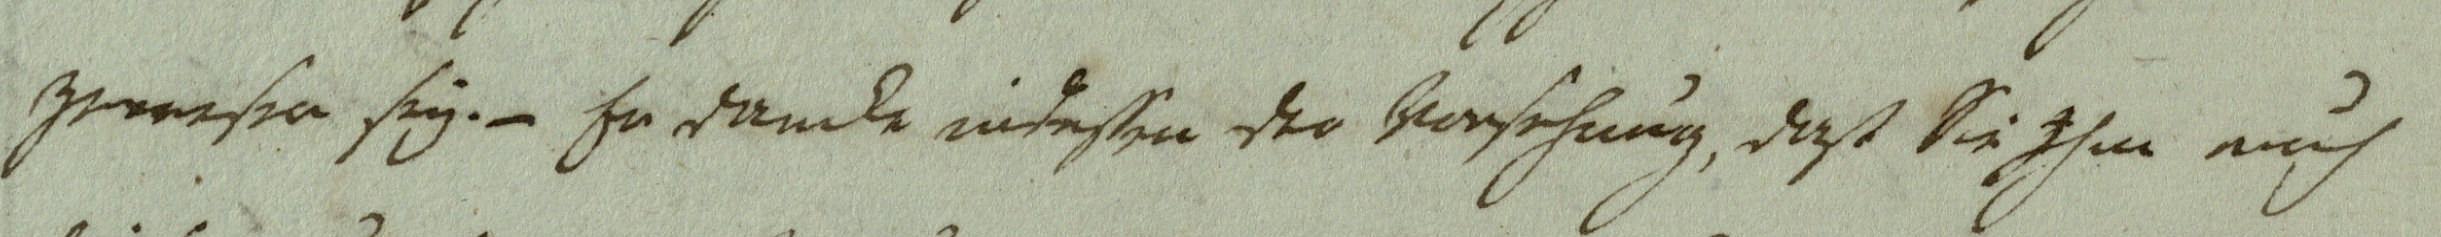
gewesen seÿ. Er dancke indessen der Vorsehung, daß Sie Ihm auch
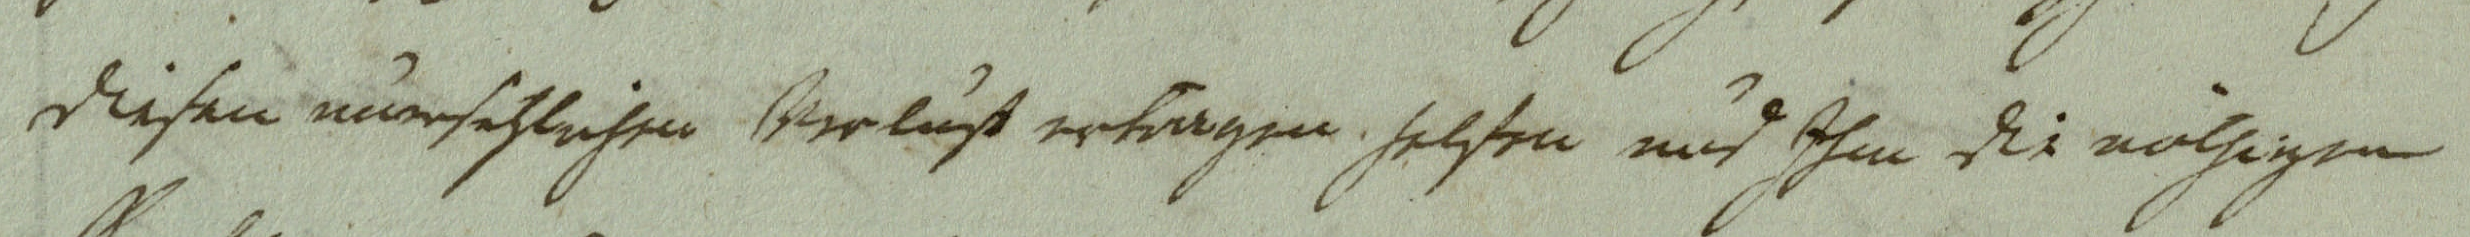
diesen unersetzlichen Verlust ertragen helfen und Ihm die nöthigen
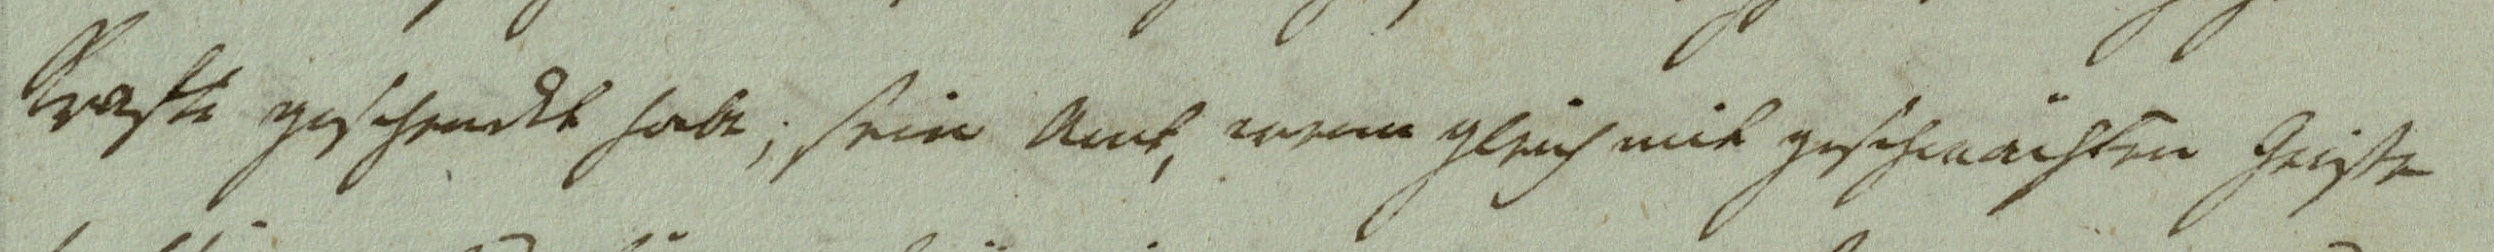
Kräfte geschenckt habe; sein Amt, wenn gleich mit geschwächten Geiste
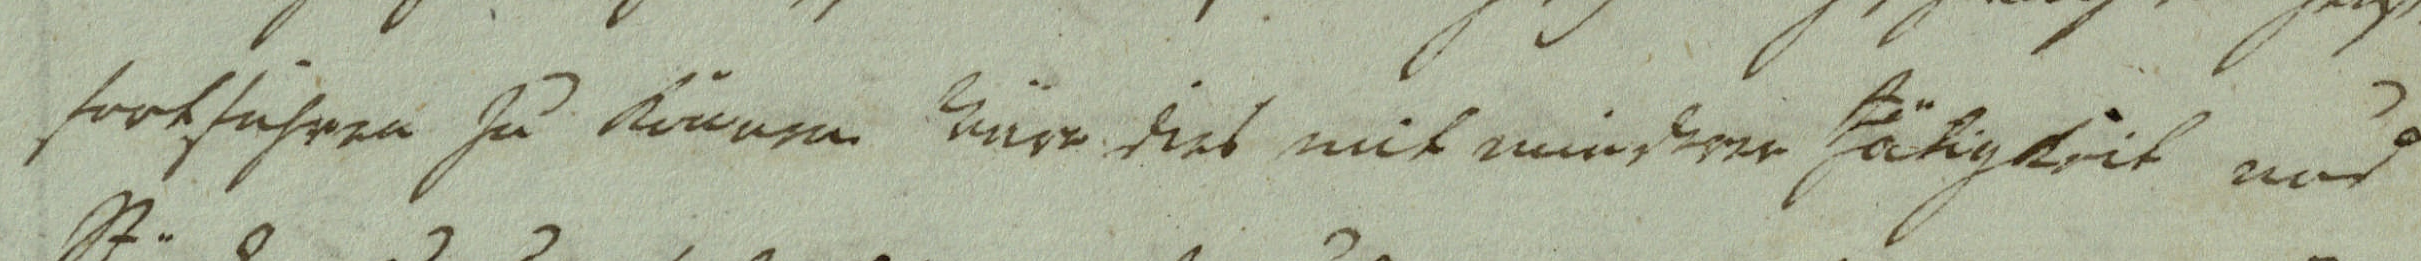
fortführen zu können. Wäre dies mit minderer Tätigkeit und
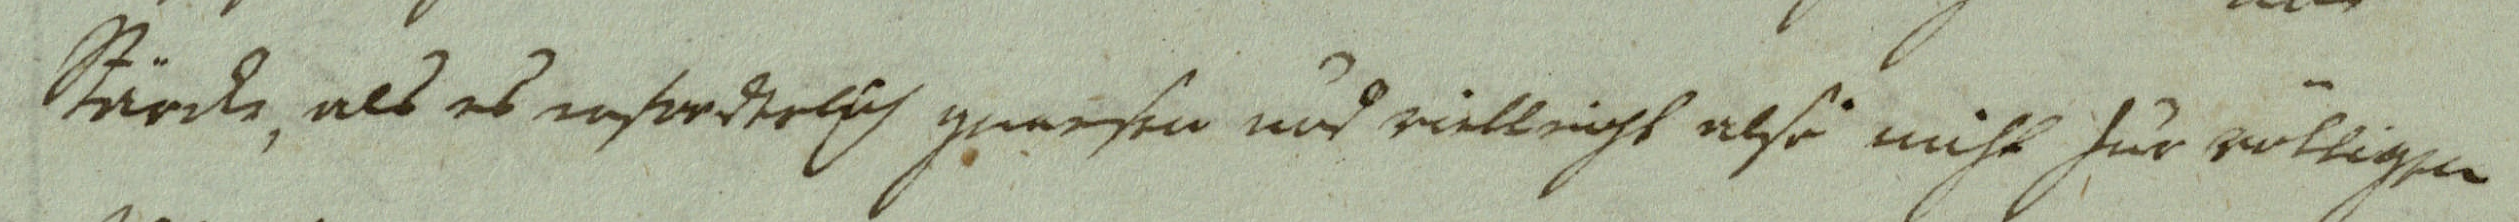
Stärcke, als es erforderlich gewesen und vielleicht also nicht zur völligen
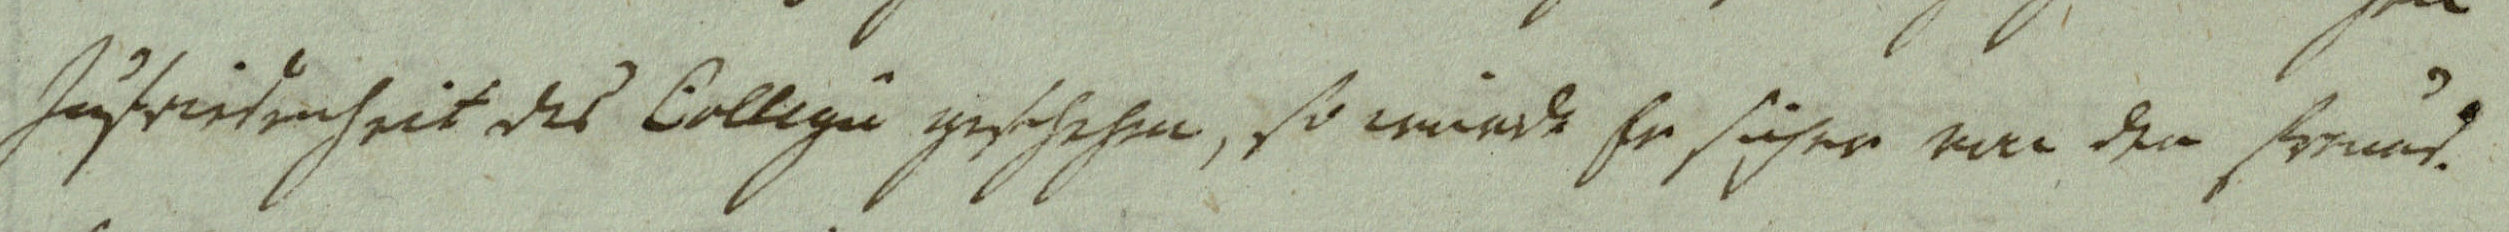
Zufriedenheit des Collegii geschehen, so würde Er sicher von den freund¬
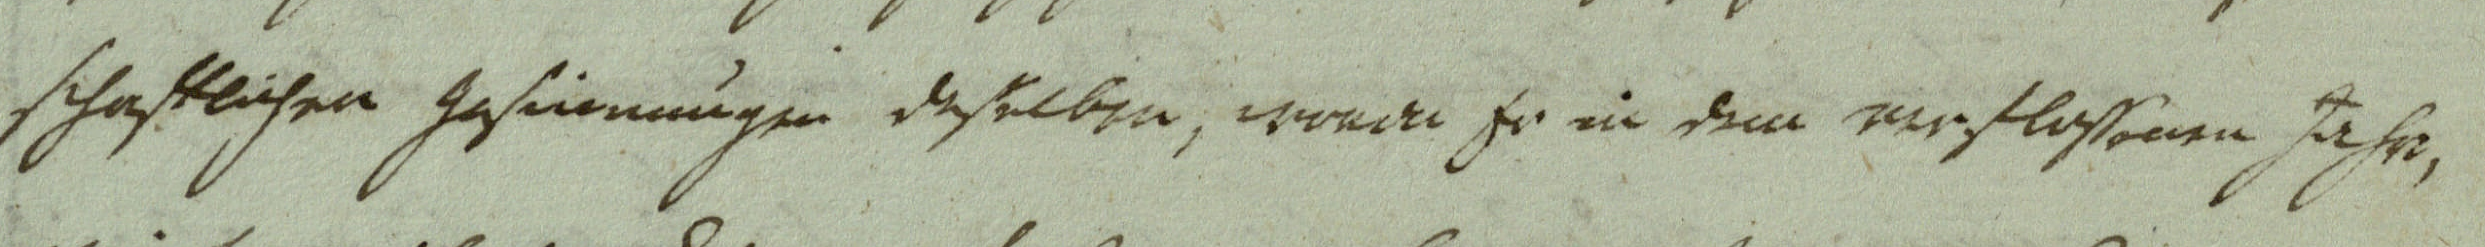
schaftlichen Gesinnungen desselben, woran Er in dem verflossenen Jahr,
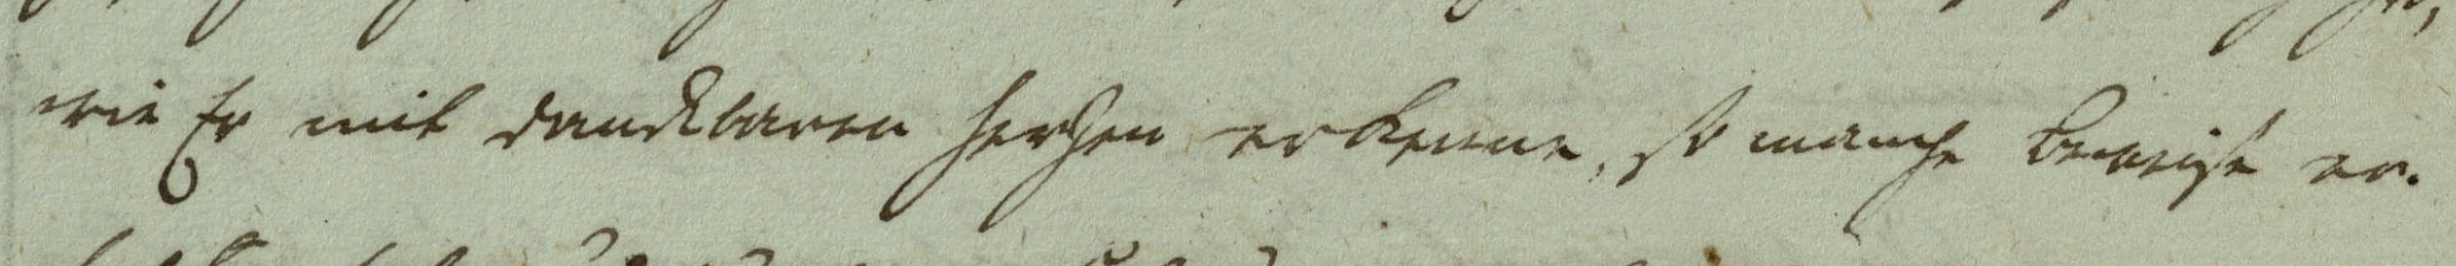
wie Er mit danckbarem Herzen erkenne, so manche Beweise er¬
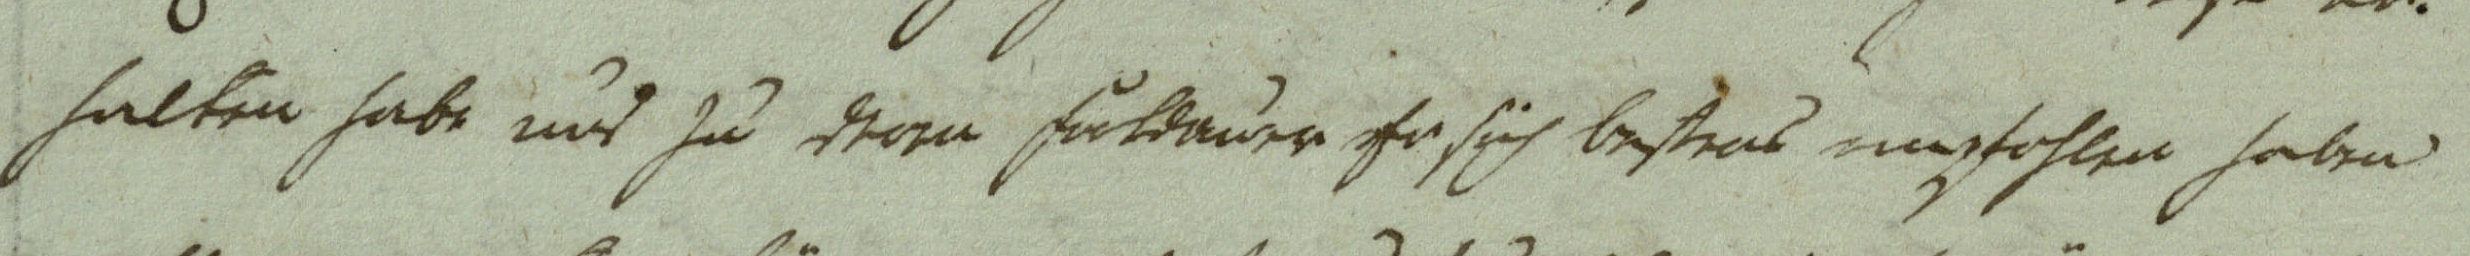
erhalten habe und zu deren Fortdauer Er sich bestens empfohlen haben
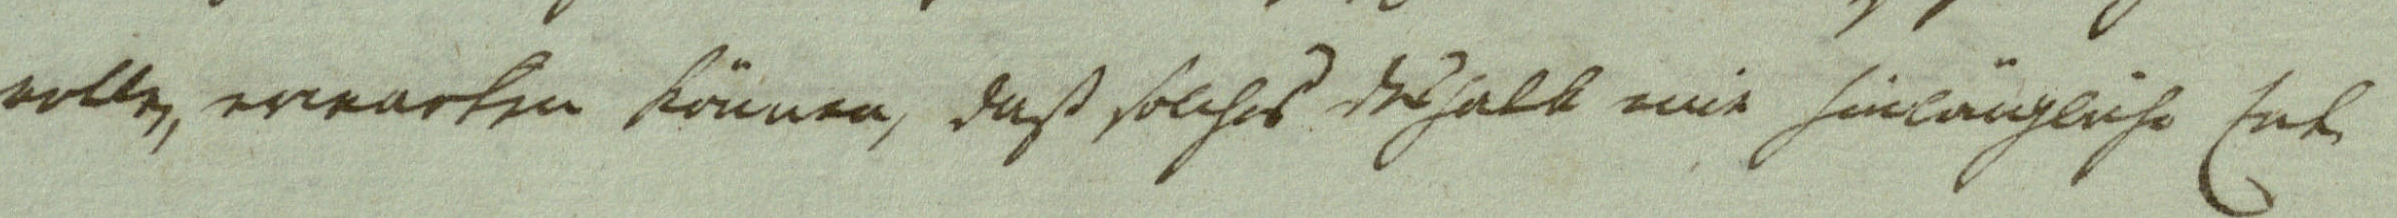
wolle, erwarten können, daß solches deshalb eine hinlängliche Ent¬
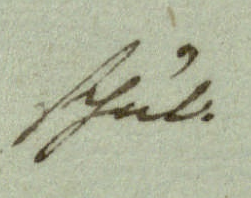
schul.
